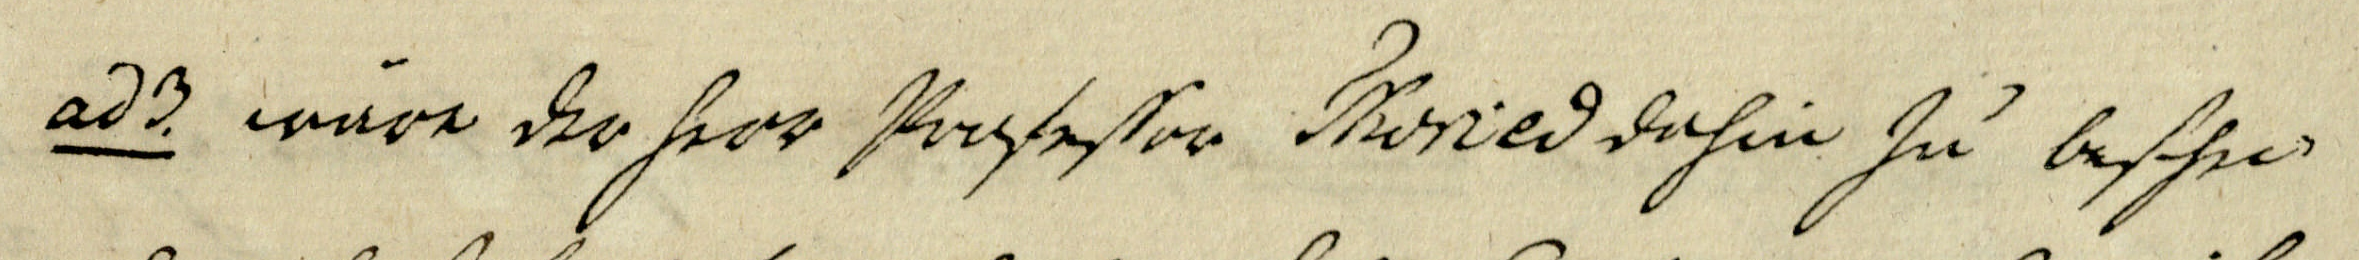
ad 3. wäre der Herr Professor Thorild dahin zu beschei¬
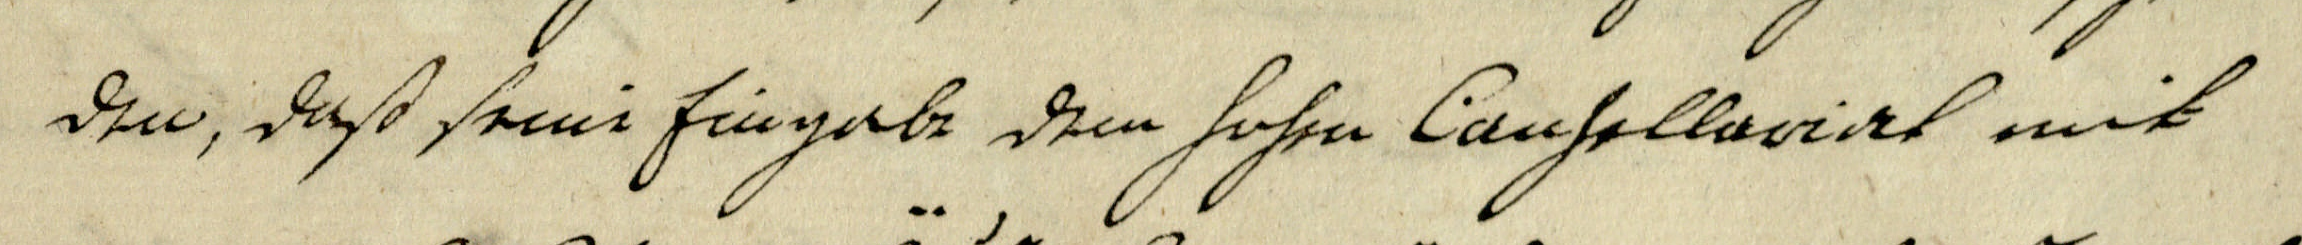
den, daß seine Eingabe dem hohen Canzellariat mit
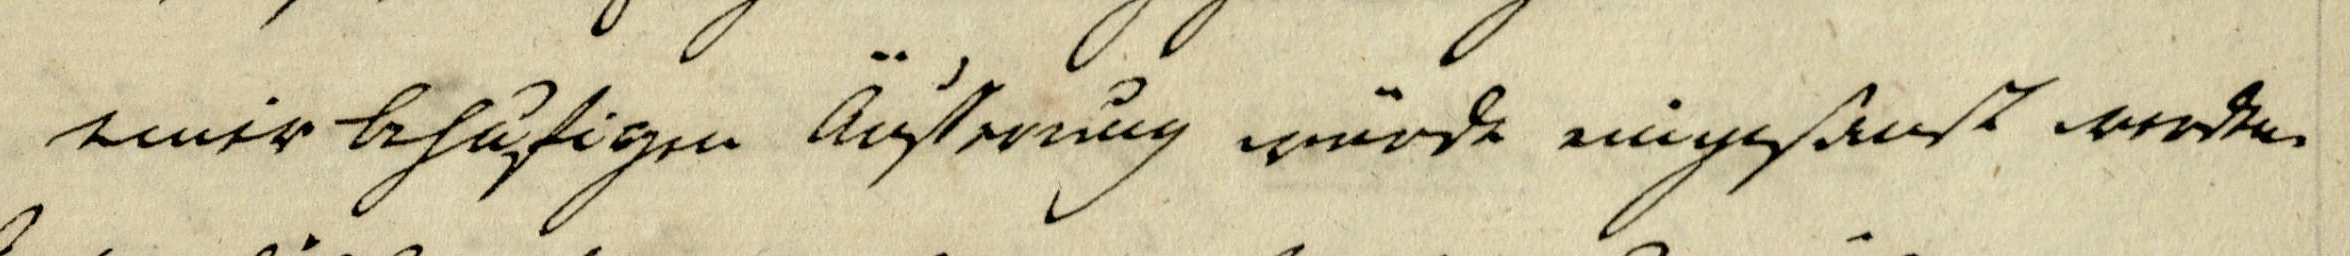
einer behufigen Äusserung würde eingesandt werden.
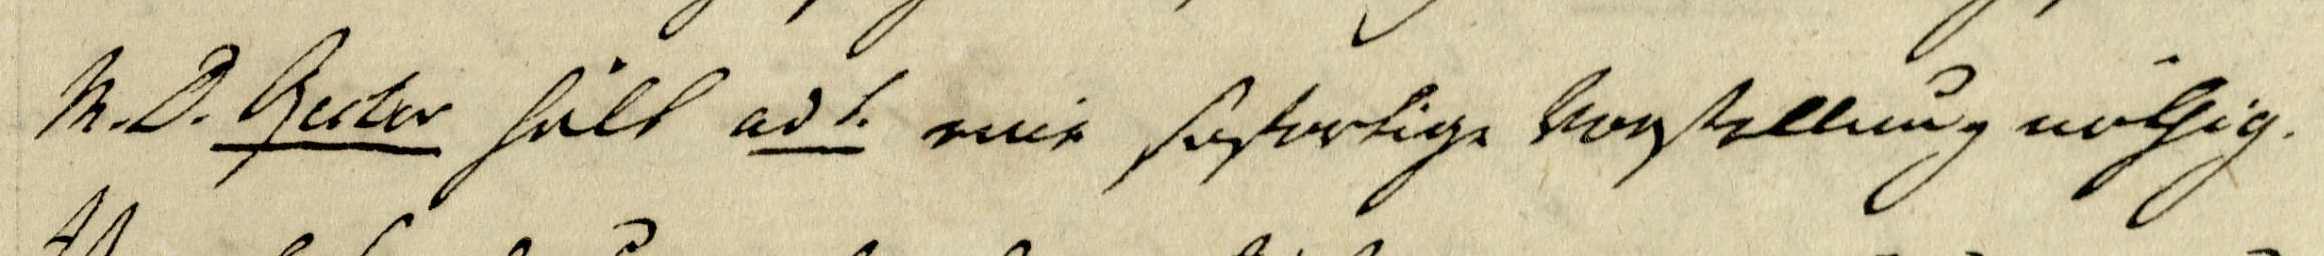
M. D. Rector hält ad 1. eine sofortige Vorstellung nöthig.
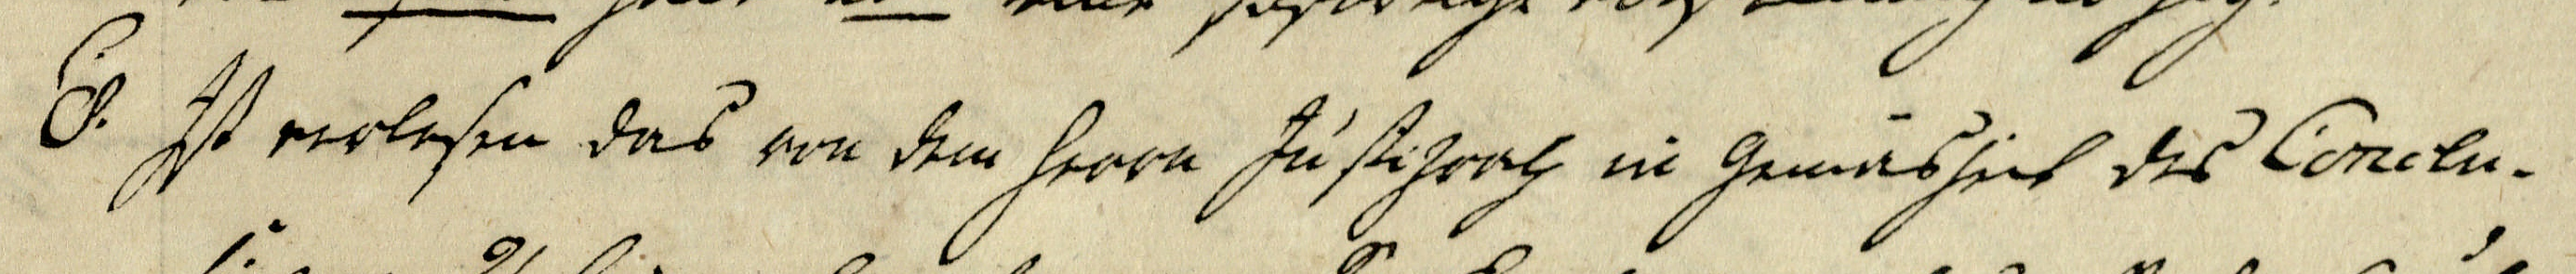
8. Ist verlesen das von dem Herrn Justizrath in Gemäsheit des Conclu¬
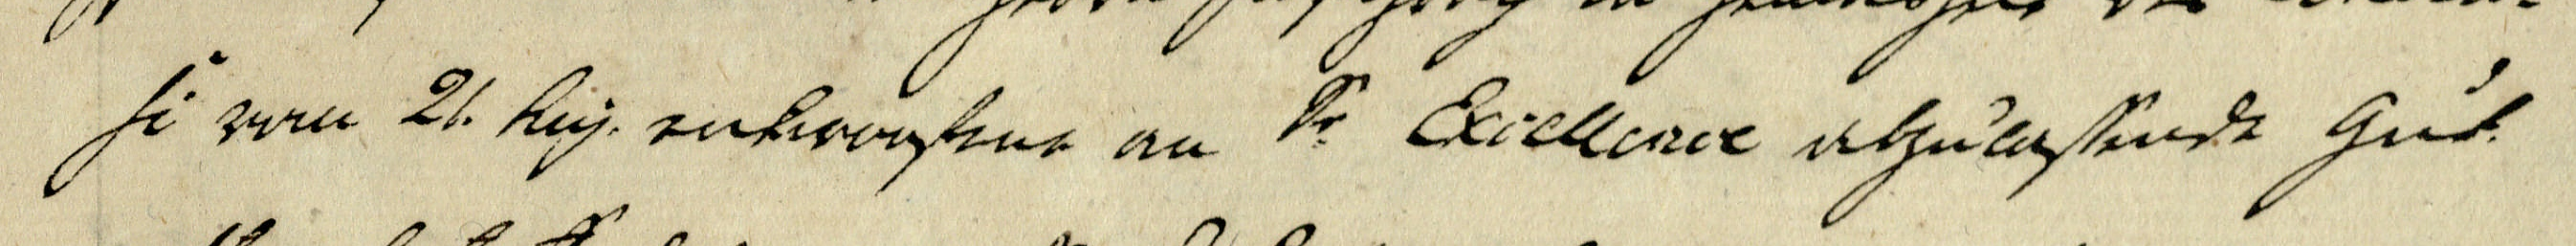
si vom 21. huj. entworfene an Sr Excellence abzulassende Gut¬
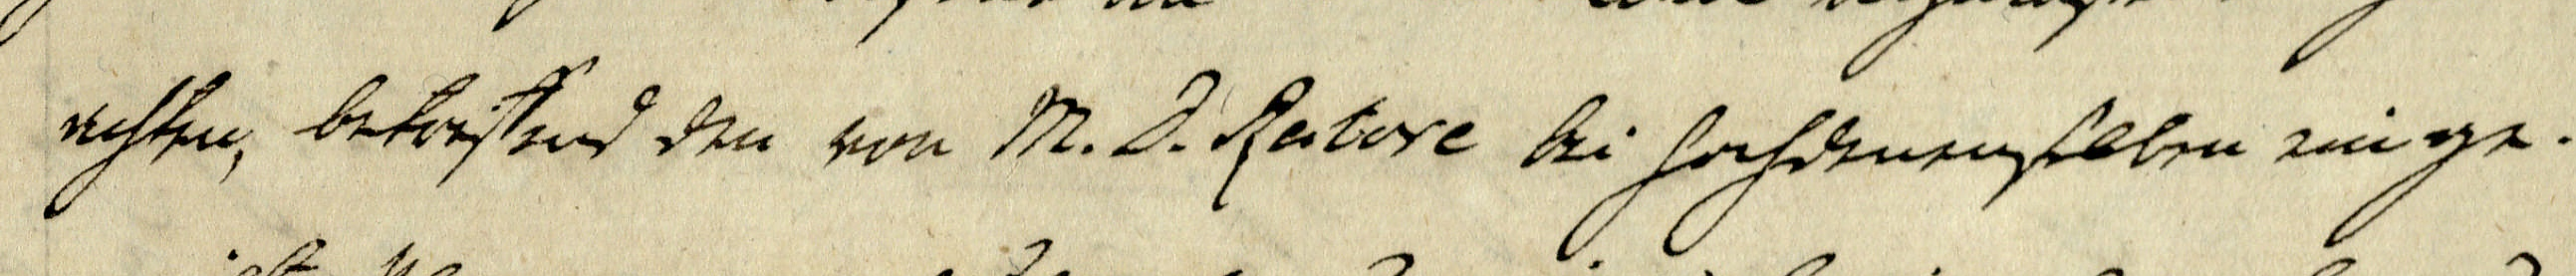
achten, betreffend den von M. D. Rectore bei hochdenenselben einge¬
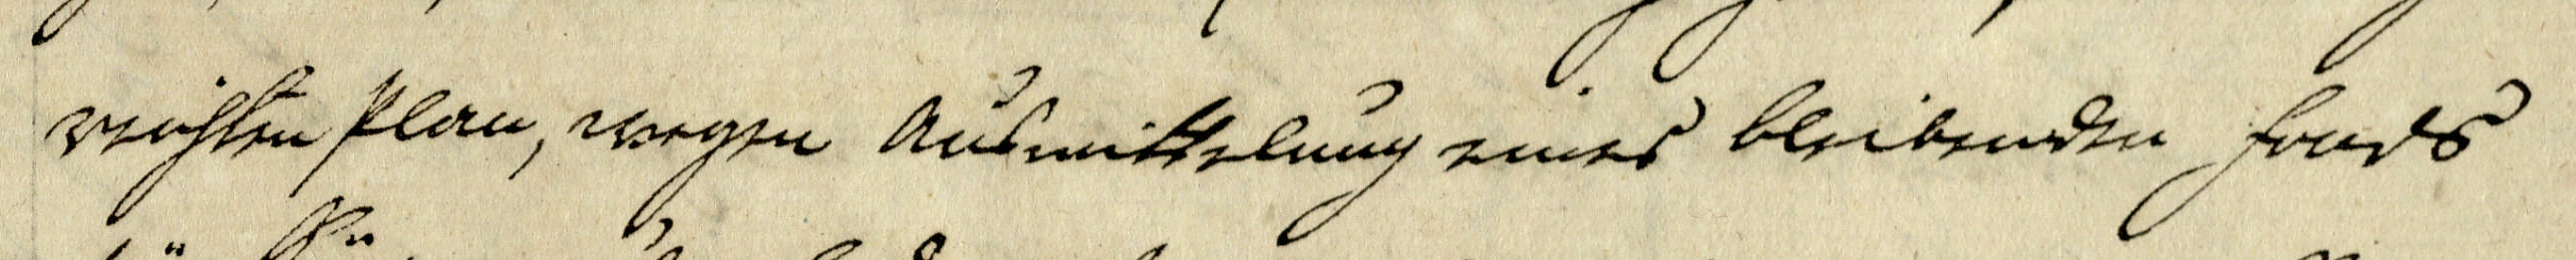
reichten Plan, wegen Ausmittelung eines bleibenden Fonds
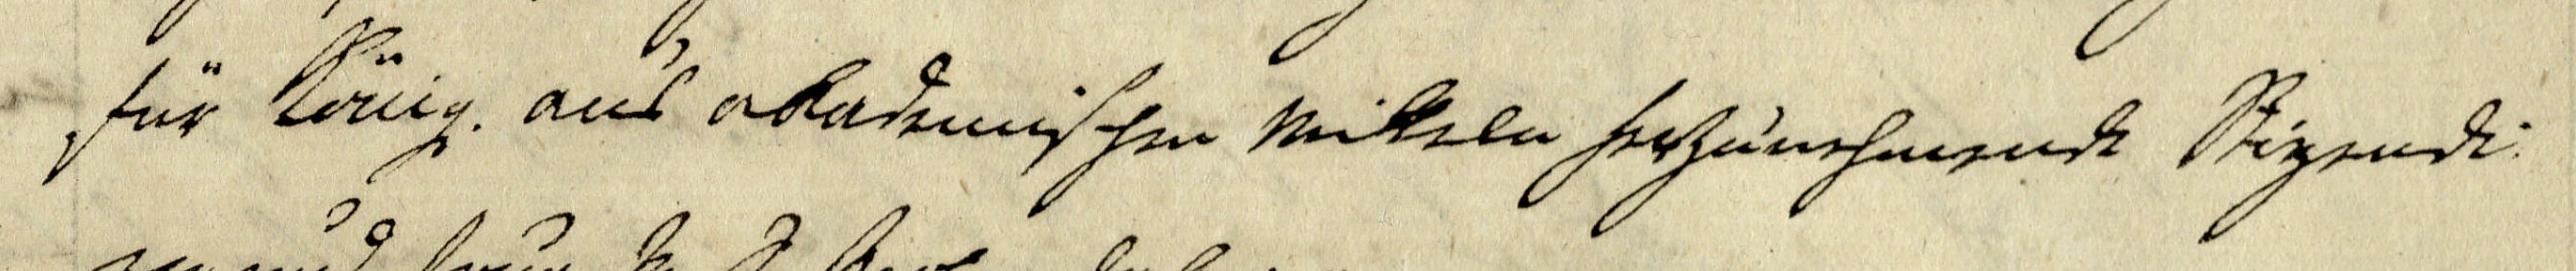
für König. aus akademischen Mitteln herzunehmende Stipendi¬
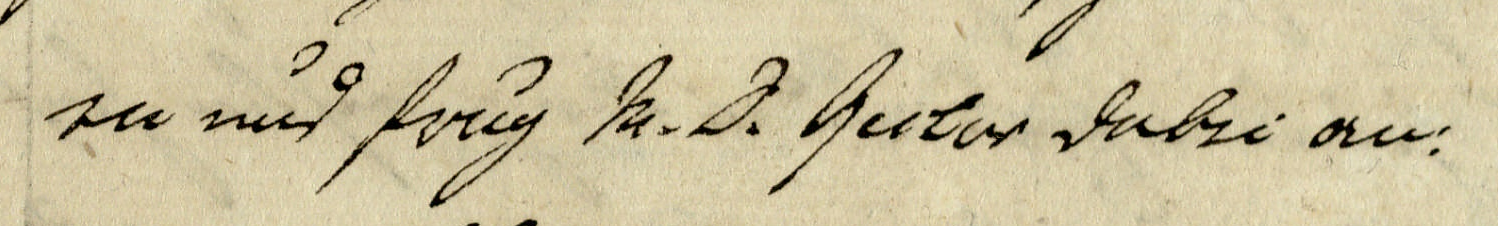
en und frug M. D. Rector dabei an:
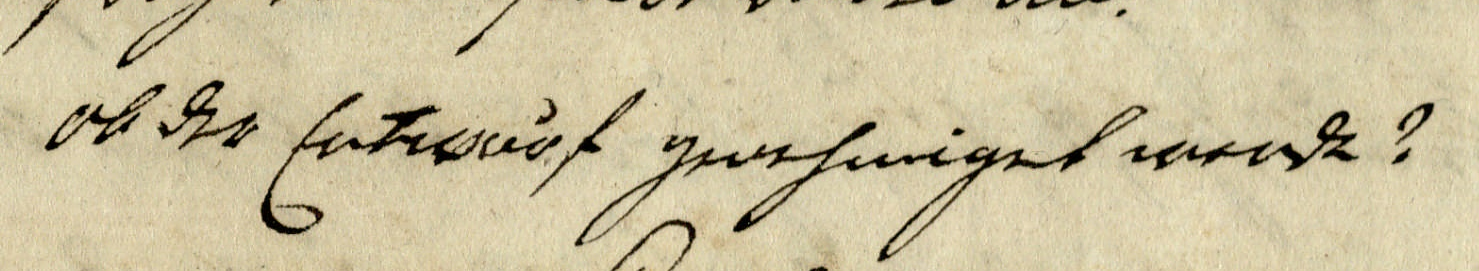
ob der Entwurf genehmiget werde?
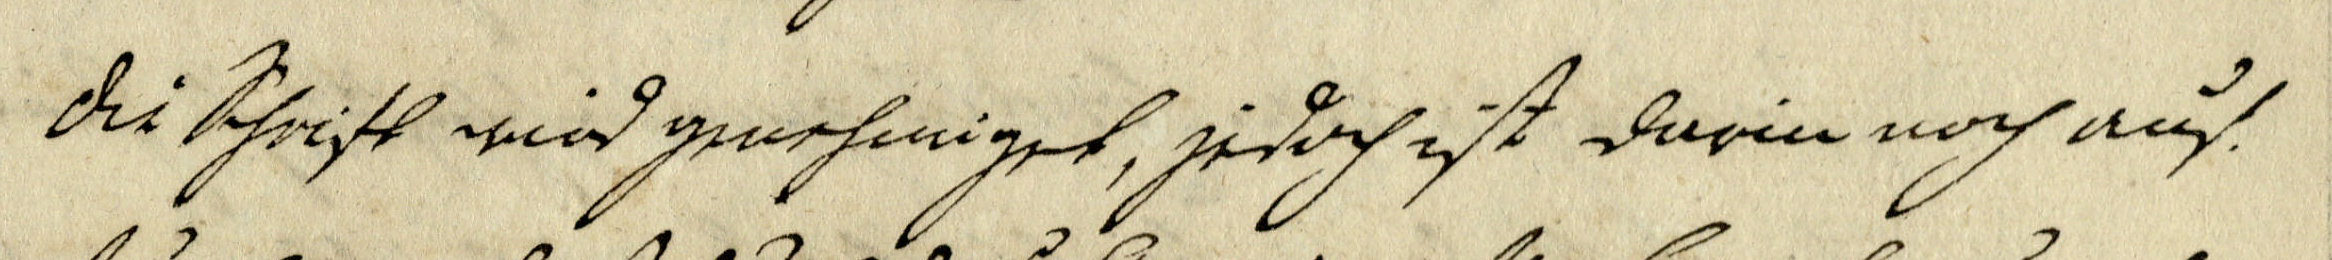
Die Schrift wird genehmiget, jedoch ist darin noch auf¬
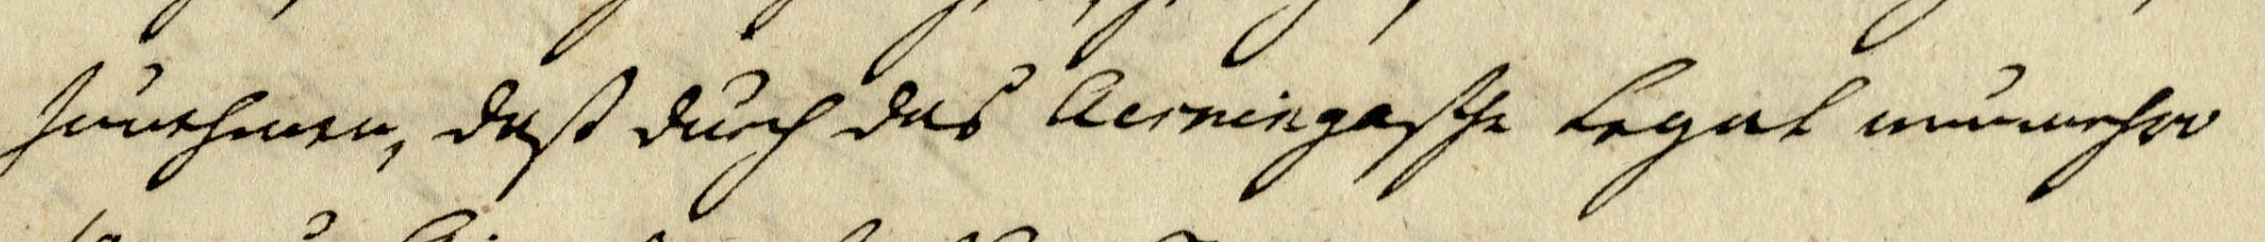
zunehmen, daß durch das Aemingasche Legat nunmehro
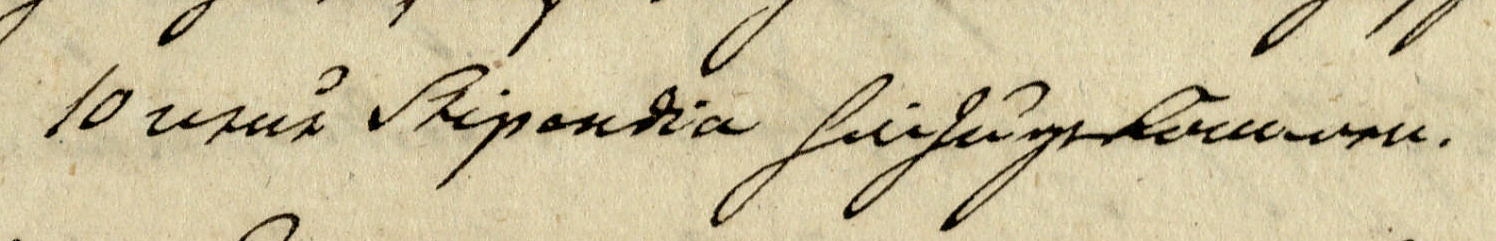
10 neue Stipendia hinzugekommen.
